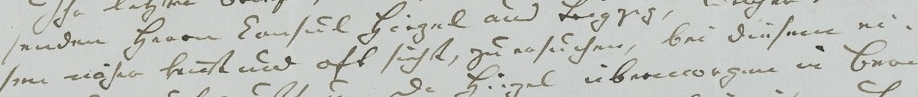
sen näher kennt und oft sieht, zu ersuchen, bei diesem ei-
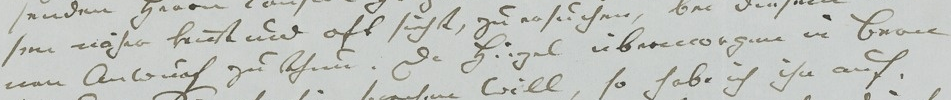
nen Anwurf zu thun. Da Hirzel übermorgen in Bern
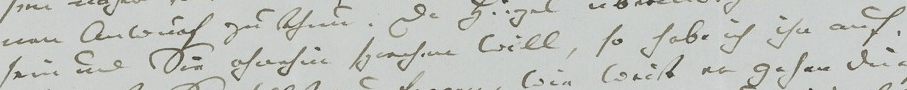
sein und Sie ohnehin sprechen will, so habe ich ihn auf-
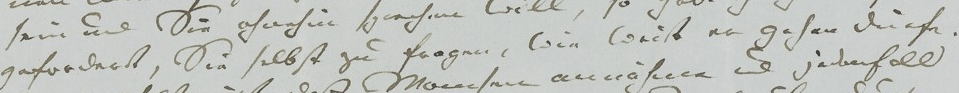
gefordert, Sie selbst zu fragen, wie weit er gehen dürfe.
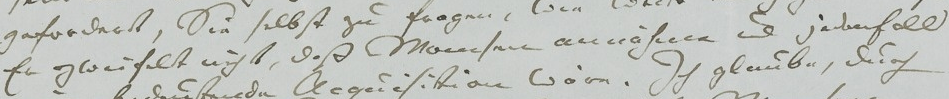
Er zweifelt nicht, daß Momsen annähme und jedenfall
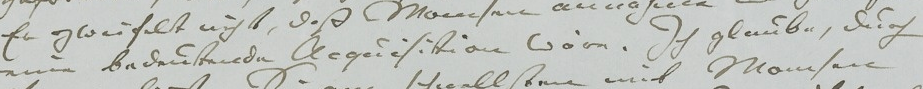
eine bedeutende Acquisition wäre. Ich glaube, durch
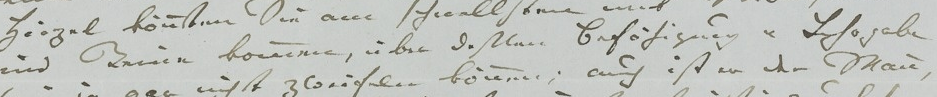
ins Reine kommen, über dessen Befähigung & Lehrgabe
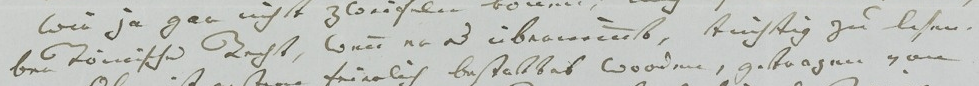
ber Römisches Recht, wenn er es übernimmt, tüchtig zu lesen.
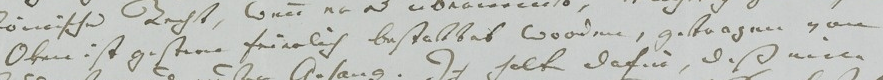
Oken ist gestern feierlich bestattet worden, getragen von
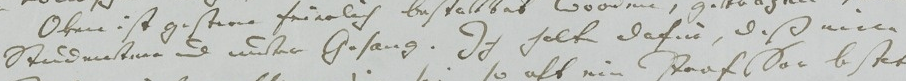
Studenten und unter Gesang. Ich halte dafür, daß eine
